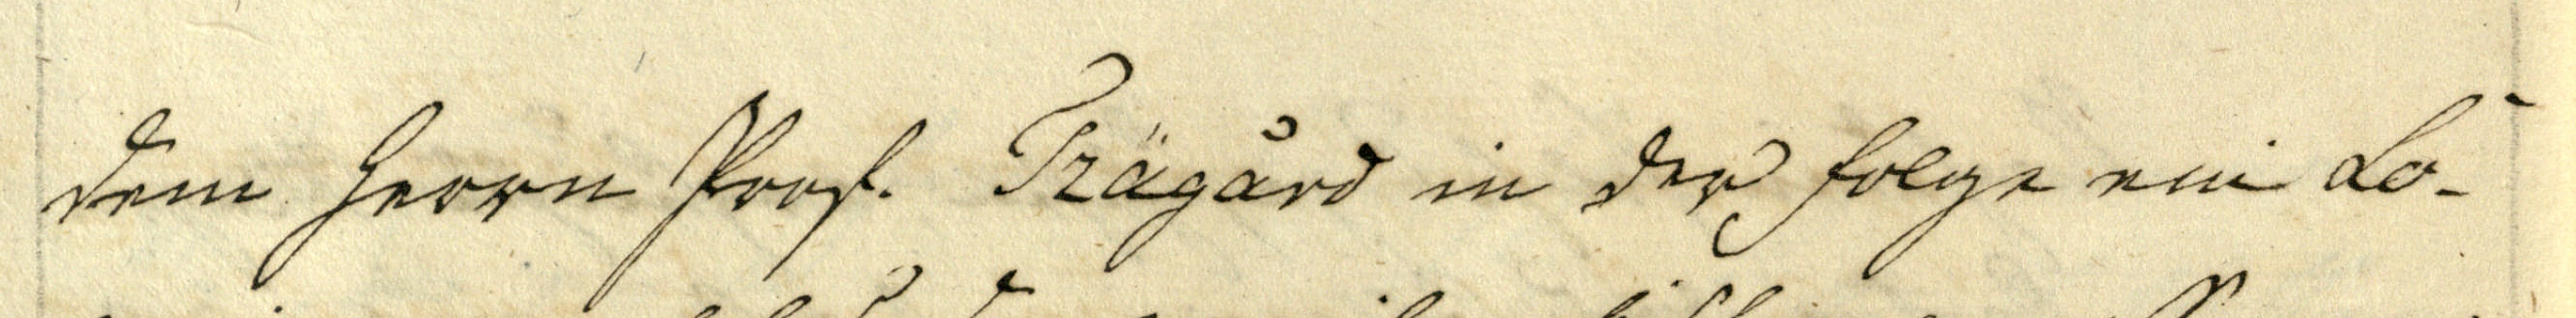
dem Herrn Prof. Trägård in der Folge ein Lo¬
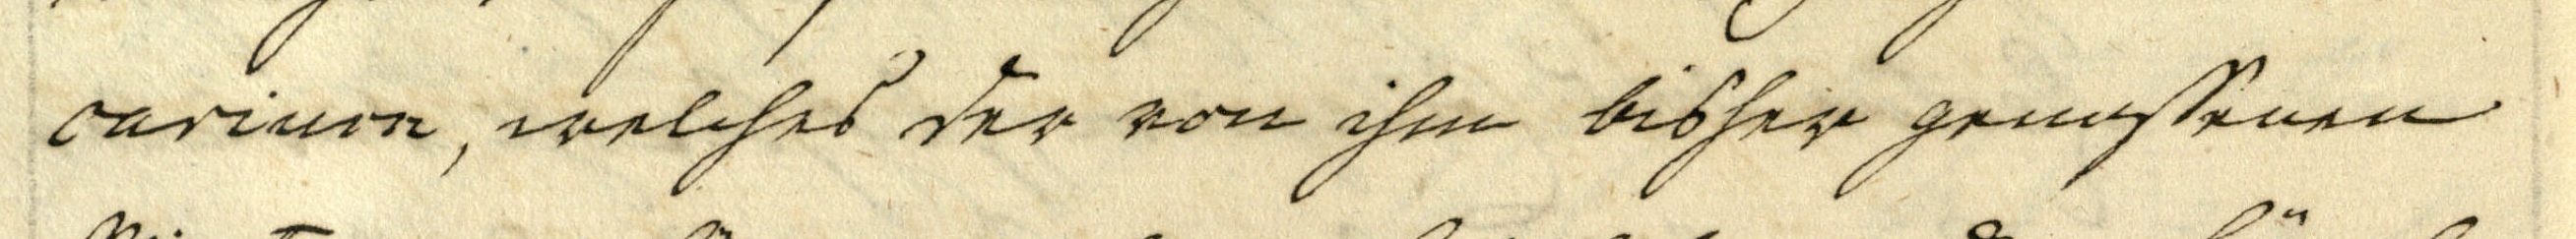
carium, welches der von ihm bisher genossenen
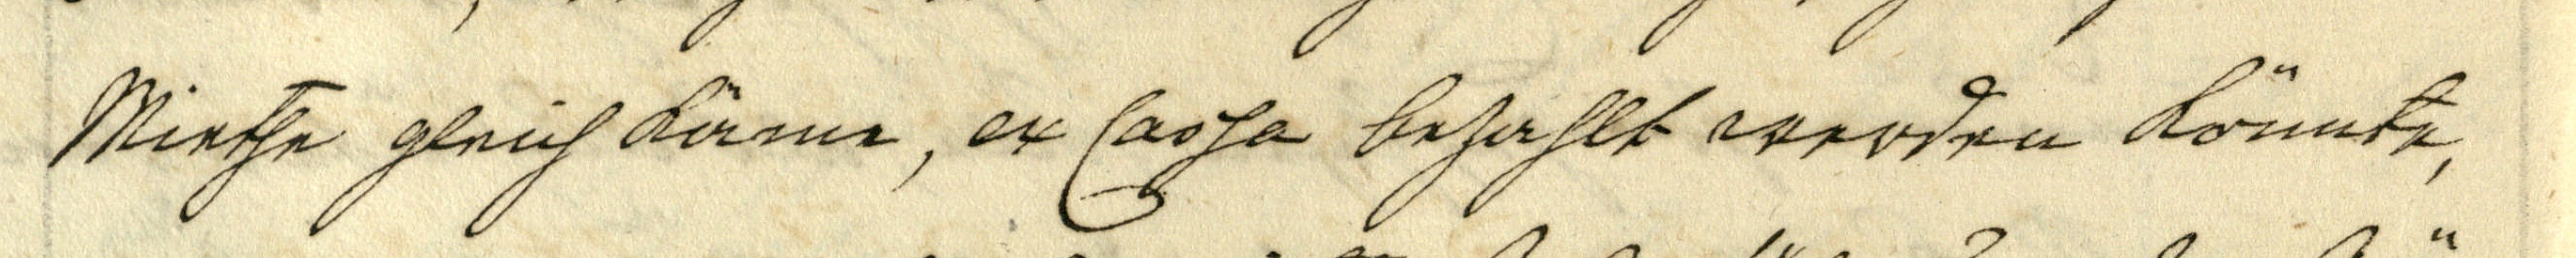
Miethe gleich käme, ex Cassa bezahlt werden könnte,
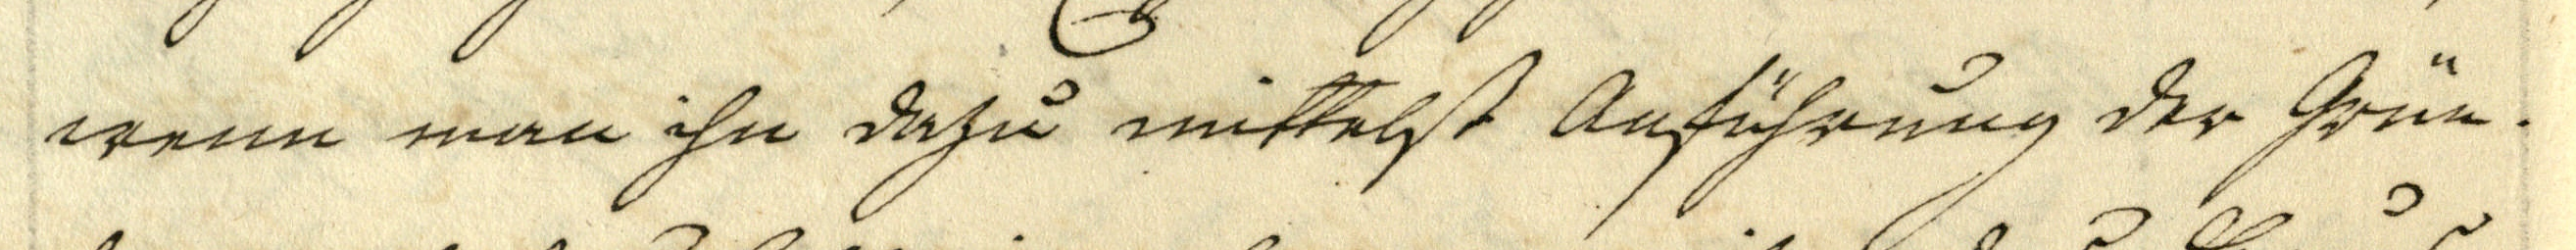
wenn man ihn dazu mittelst Anführung der Grün¬
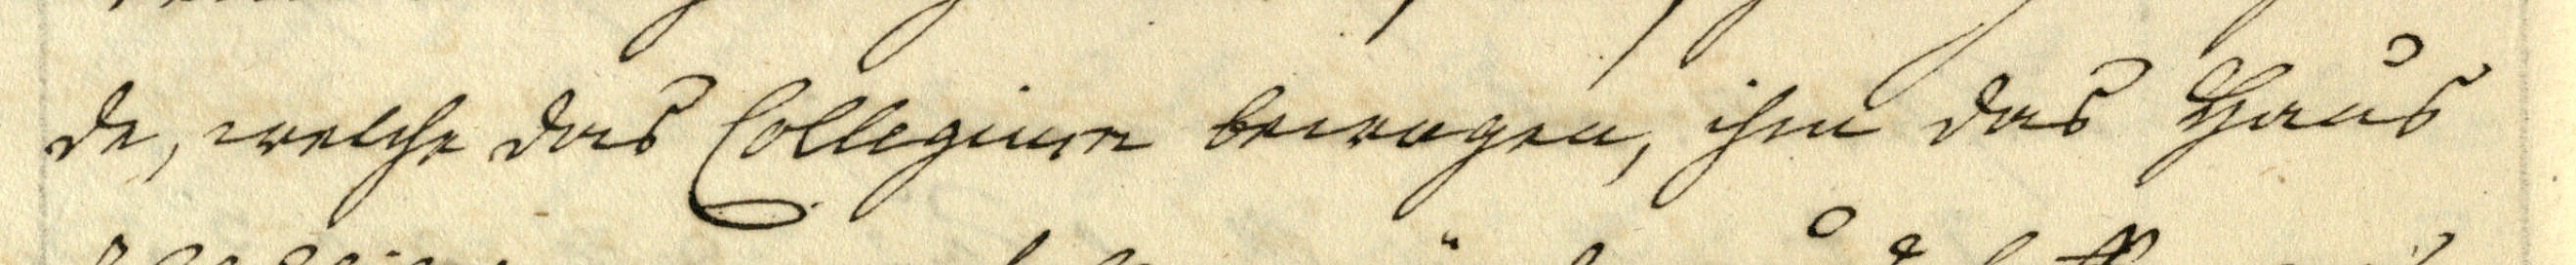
de, welche das Collegium bewogen, ihm das Haus
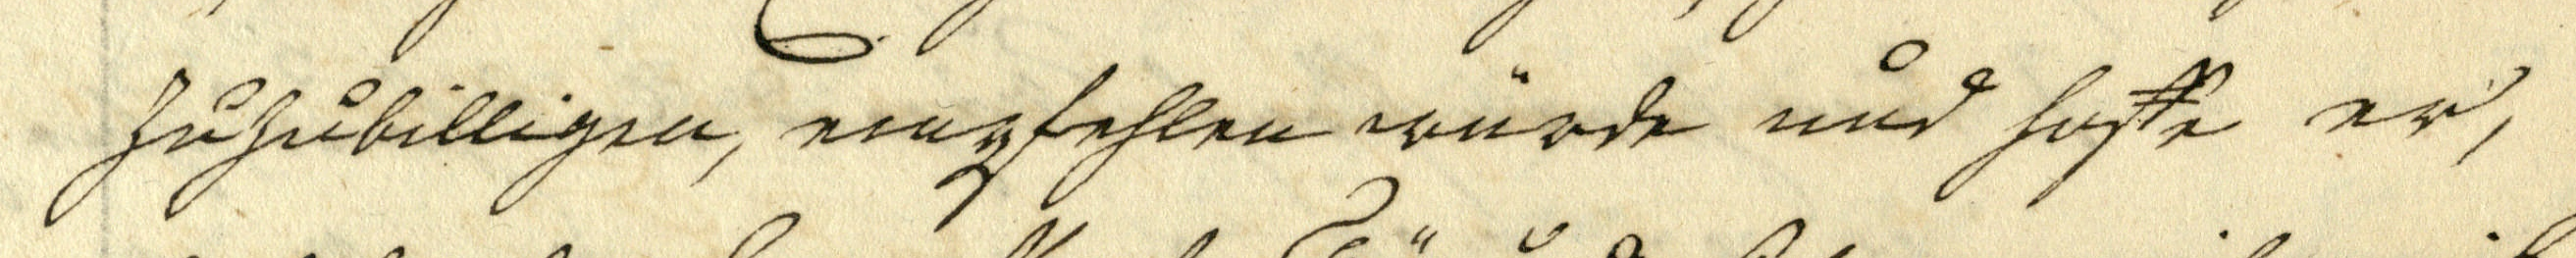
zuzubilligen, empfehlen würde und hoffe er,
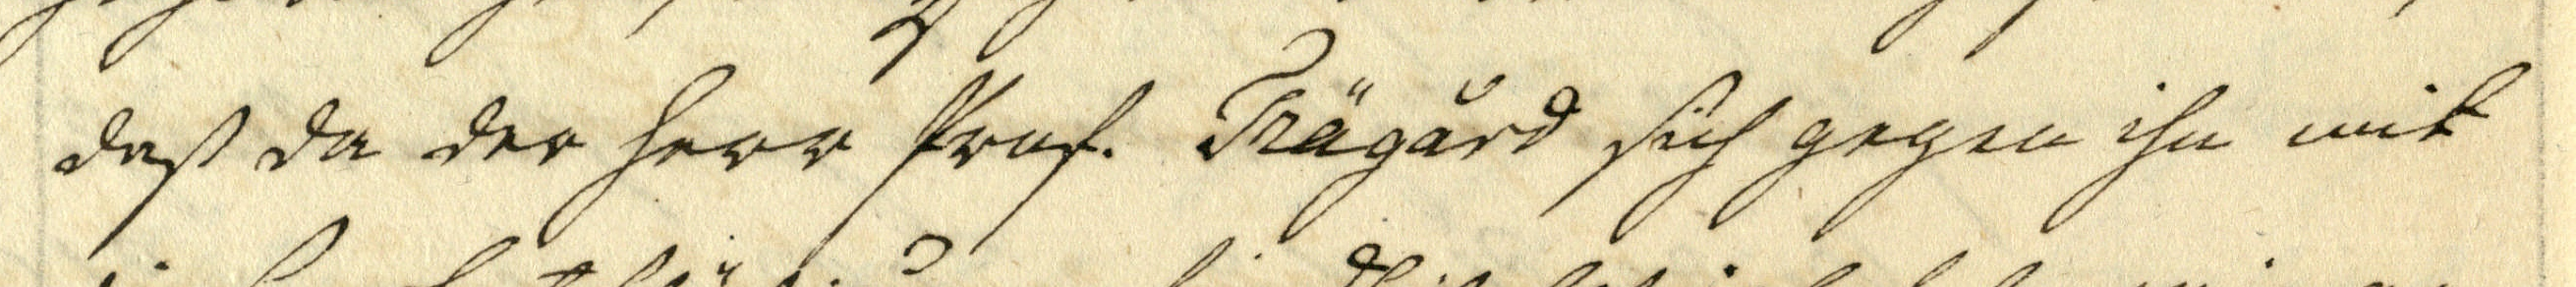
daß da der Herr Prof. Trägård sich gegen ihn mit
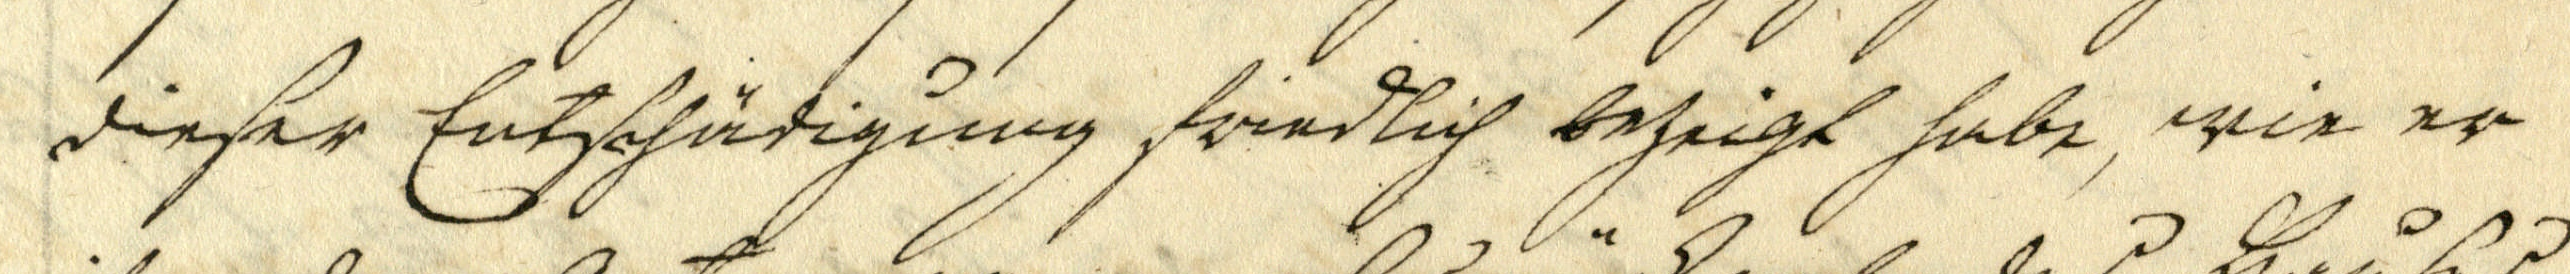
dieser Entschädigung friedlich bezeigt habe, wie er
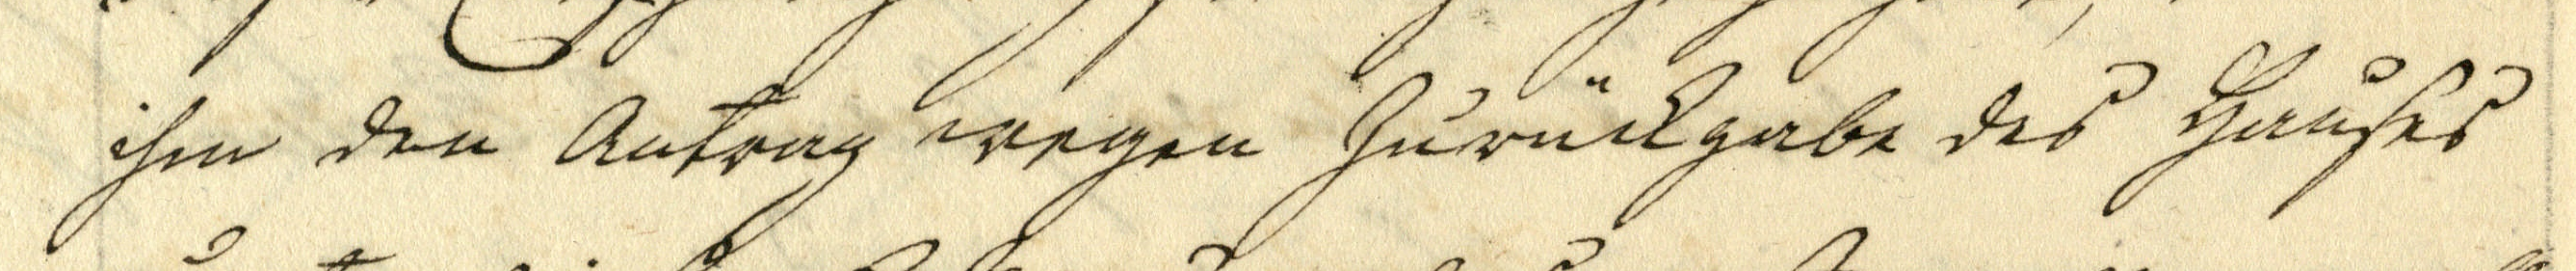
ihm den Antrag wegen Zurückgabe des Hauses
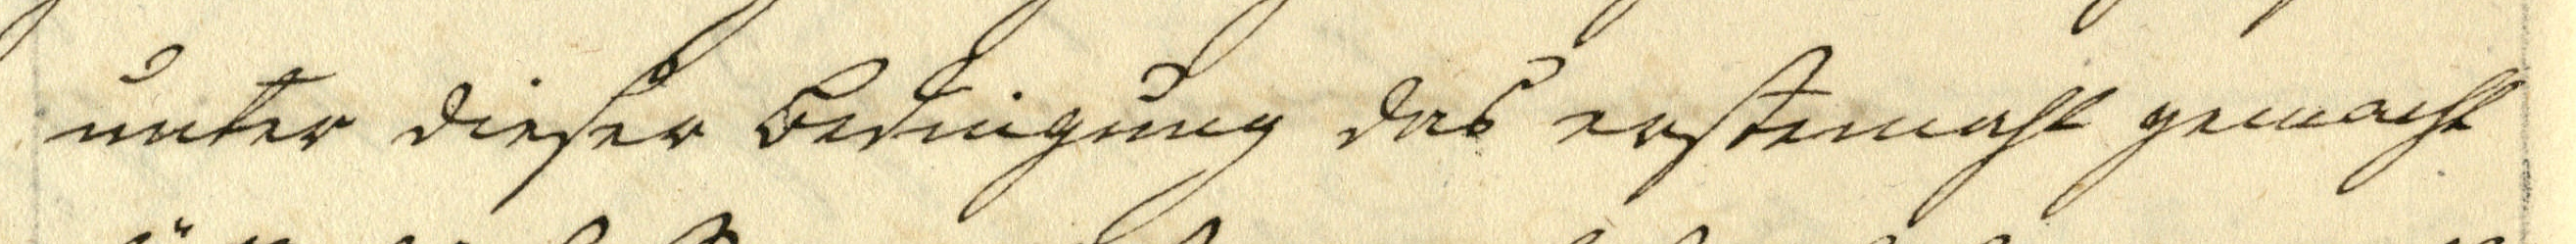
unter dieser Bedingung das erstemahl gemacht
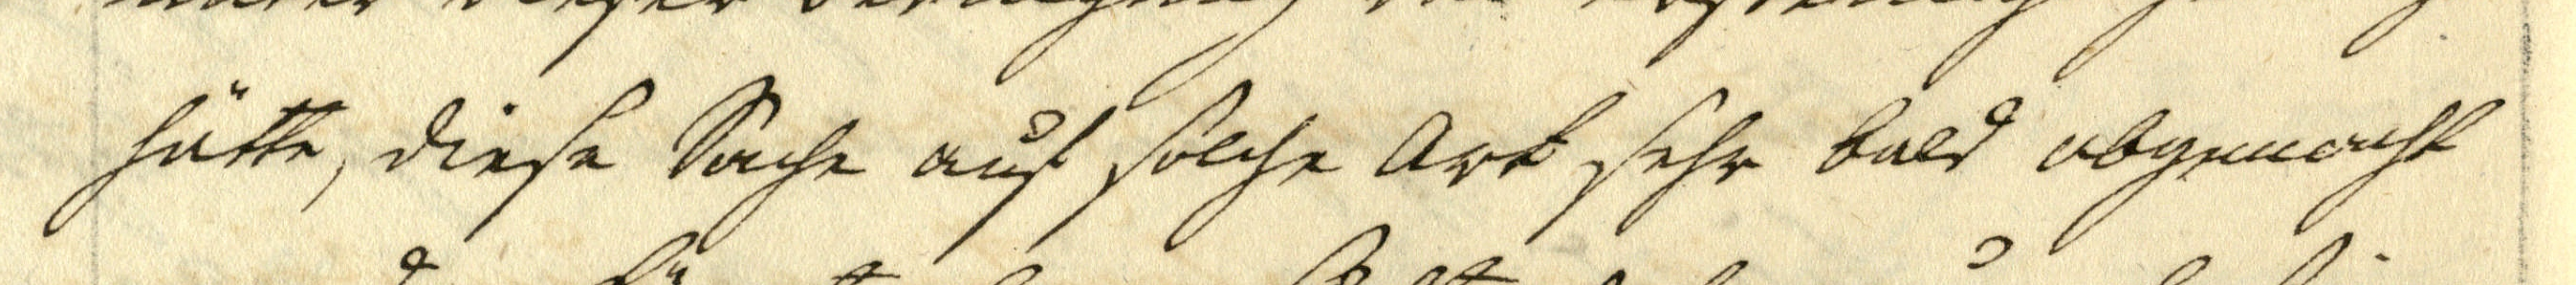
hätte, diese Sache auf solche Art sehr bald abgemacht
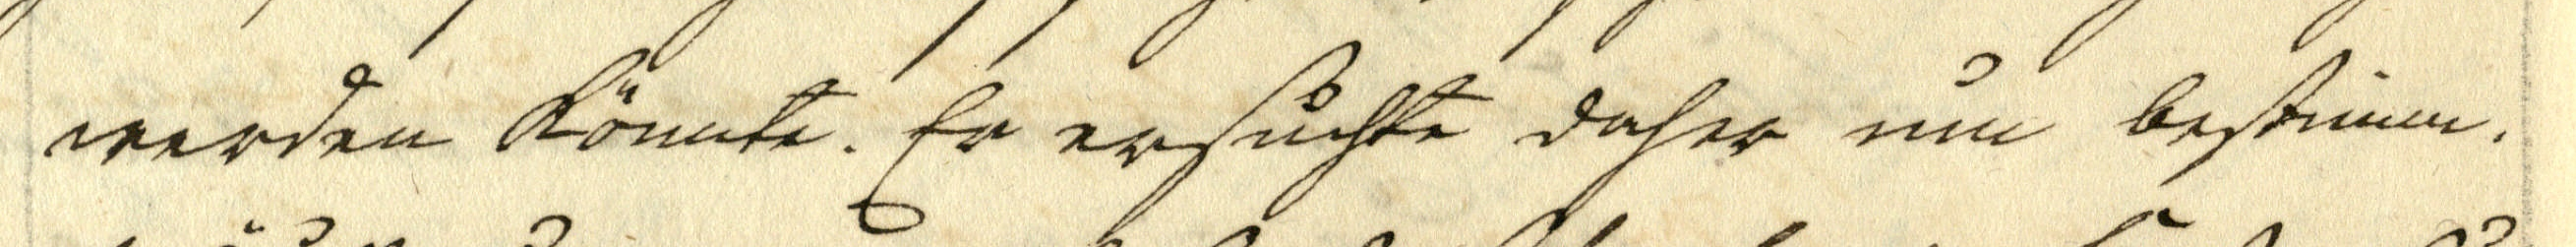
werden könnte. Er ersuchte daher um bestimm¬
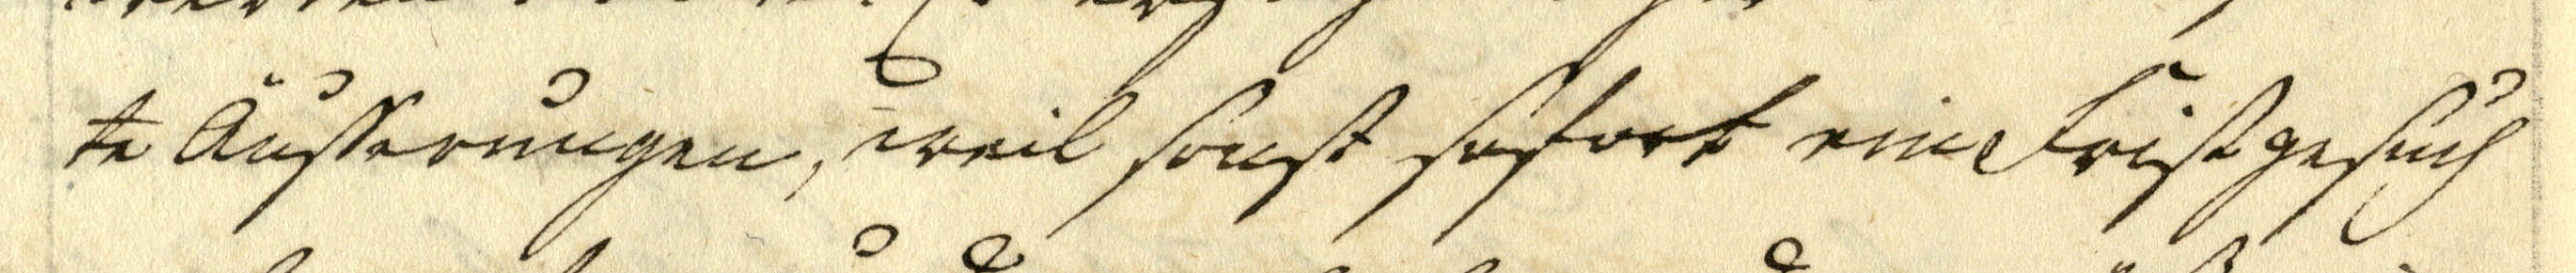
te Äusserungen, weil sonst sofort ein Fristgesuch
